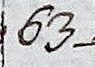63
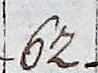62
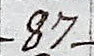87
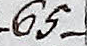65
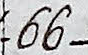66
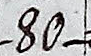80
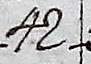42
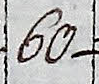60
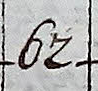62
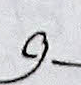9
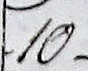10
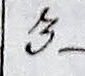30
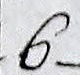6
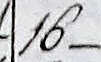16
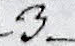3
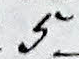5
